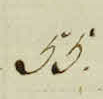55
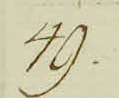49
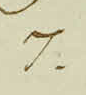7
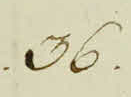36
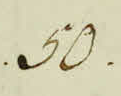50
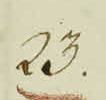23
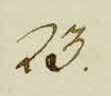23
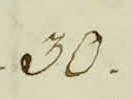30
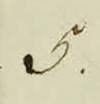5
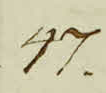47
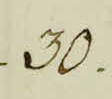30
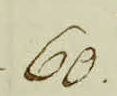60
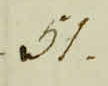51
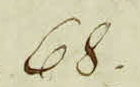68
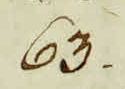63
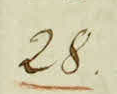28
